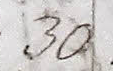30
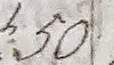50
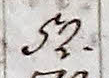52
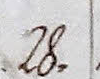28.
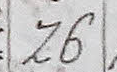26
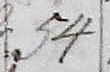54
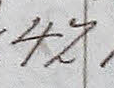42
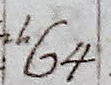64
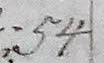54
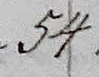54
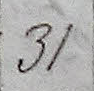31
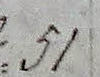51
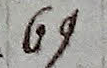69
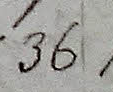36
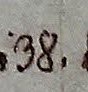38
